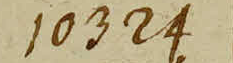10324
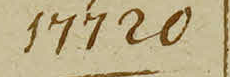17720
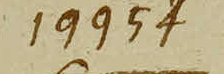19954
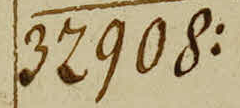32908
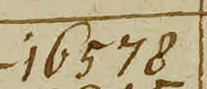16578
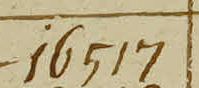16517
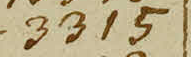3315
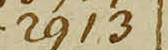2913
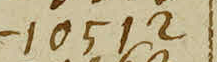10512
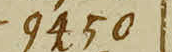9450
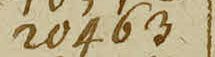20463
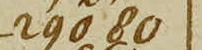29080
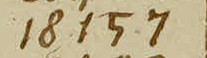18157
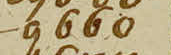9660
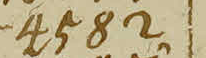4582
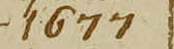1677
